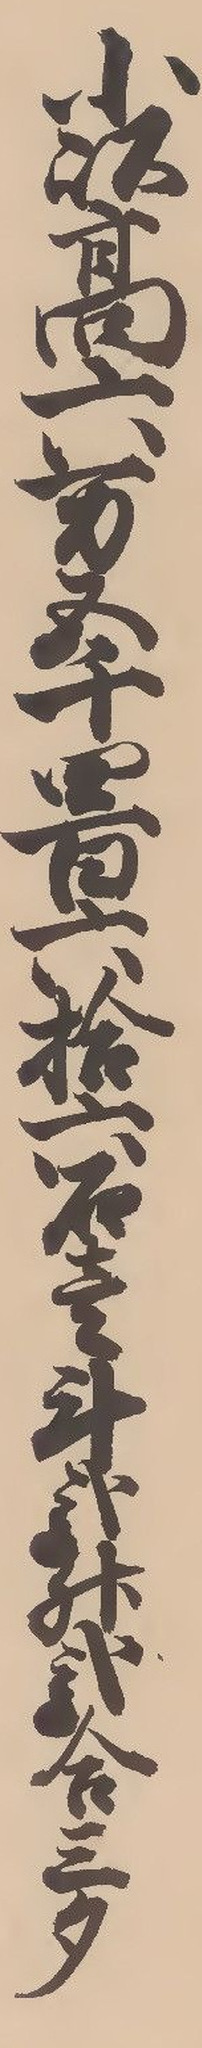小以高六万五千四百六拾六石壱斗弐升弐合三勺
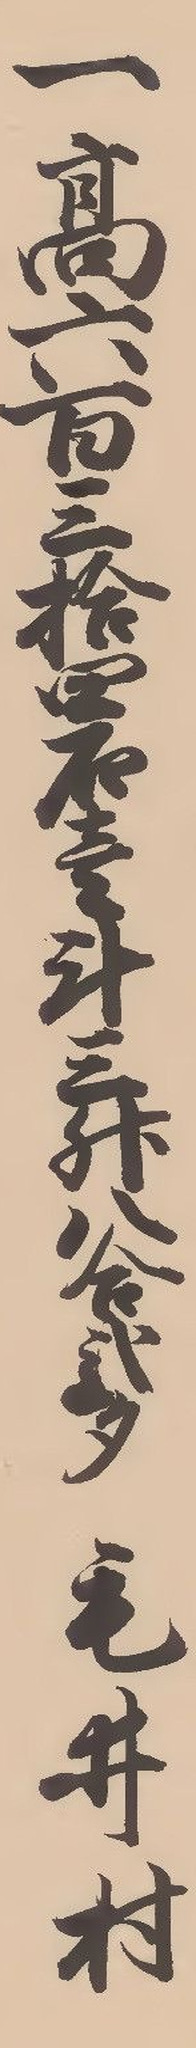一高六百三拾四石壱斗三升八合弐勺毛井村
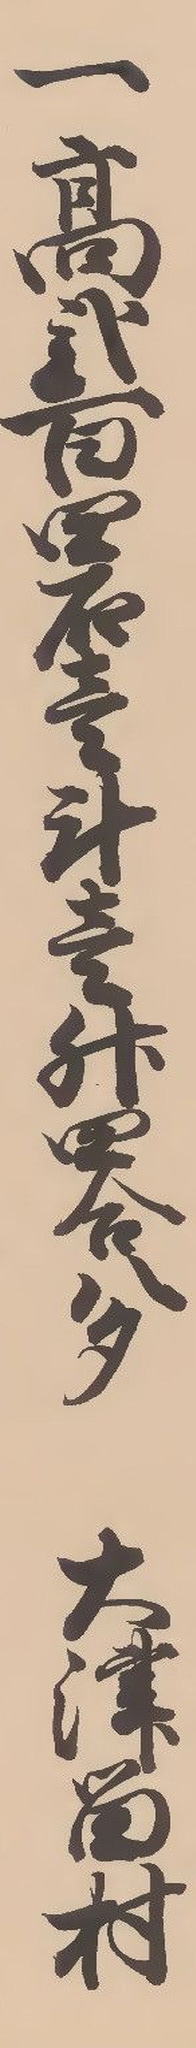一高弐百四石壱斗壱升四合八勺大津留村
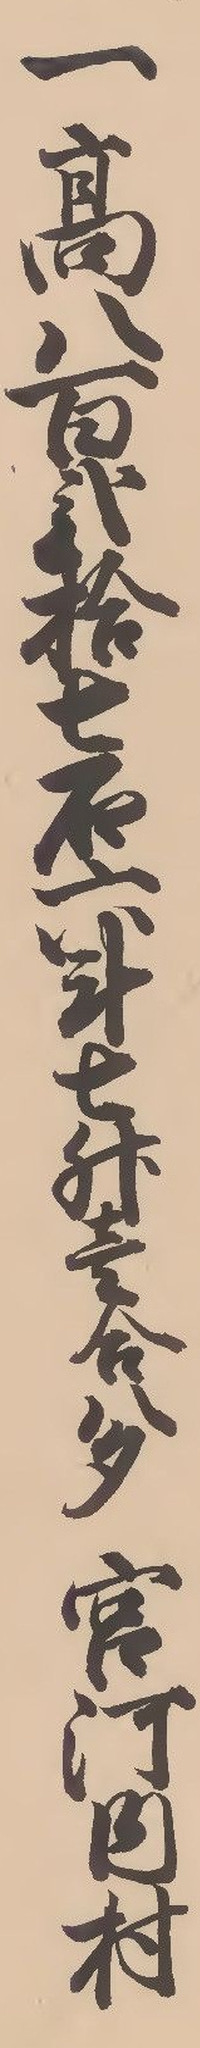一高八百弐拾七石六斗七升壱合八勺宮河内村

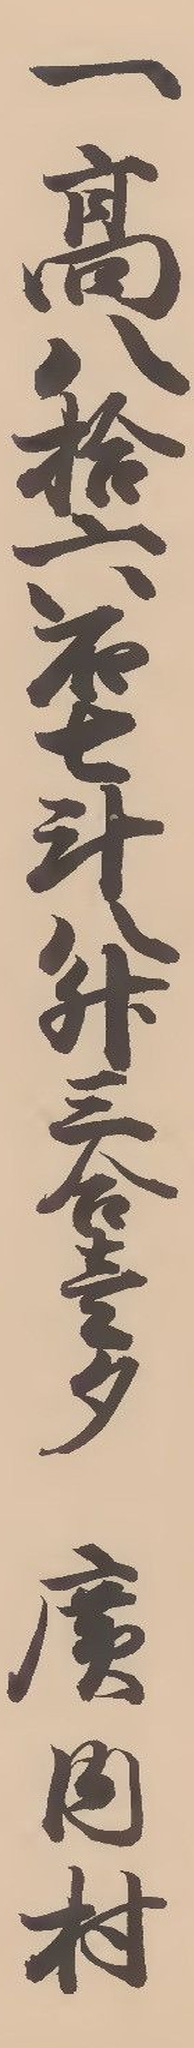一高八拾六石七斗八升三合壱勺広内村
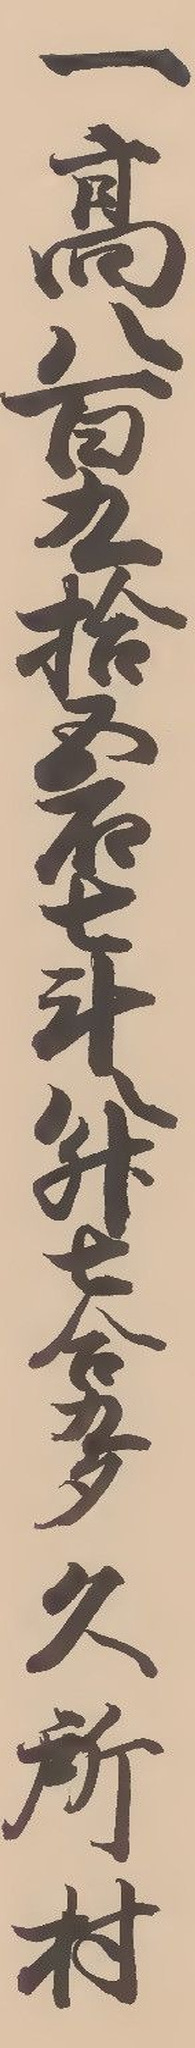一高八百九拾五石七斗八升七合九勺久所村
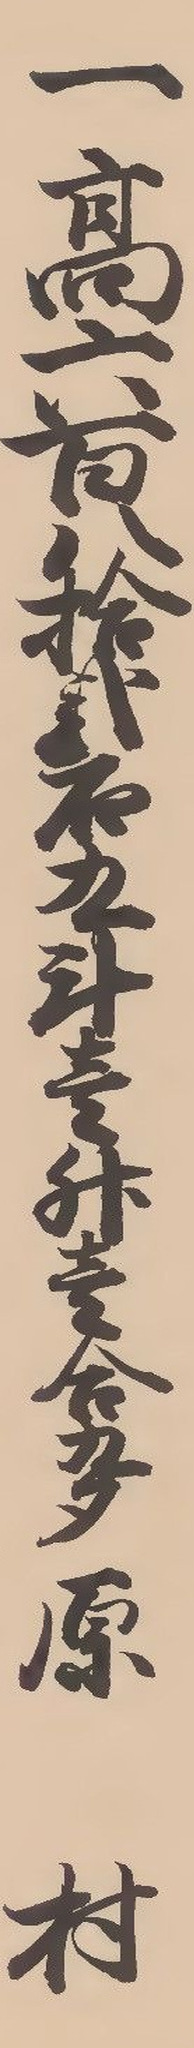一高六百八拾弐石九斗壱升壱合九勺原村
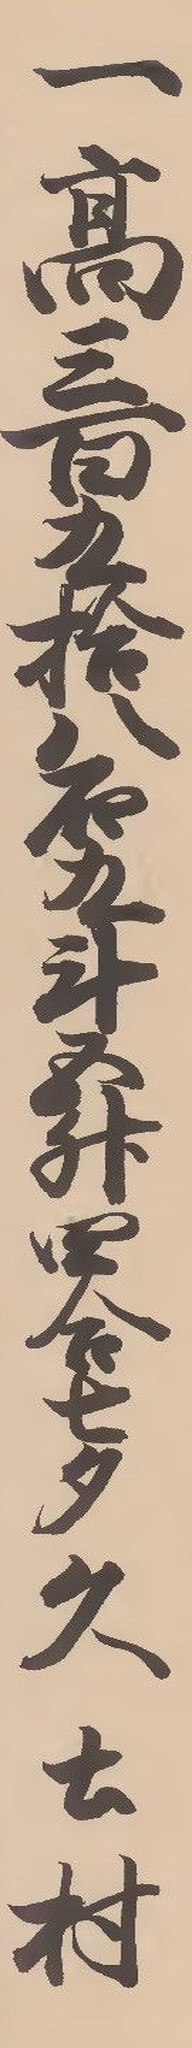一高三百九拾八石九斗五升四合七勺久土村
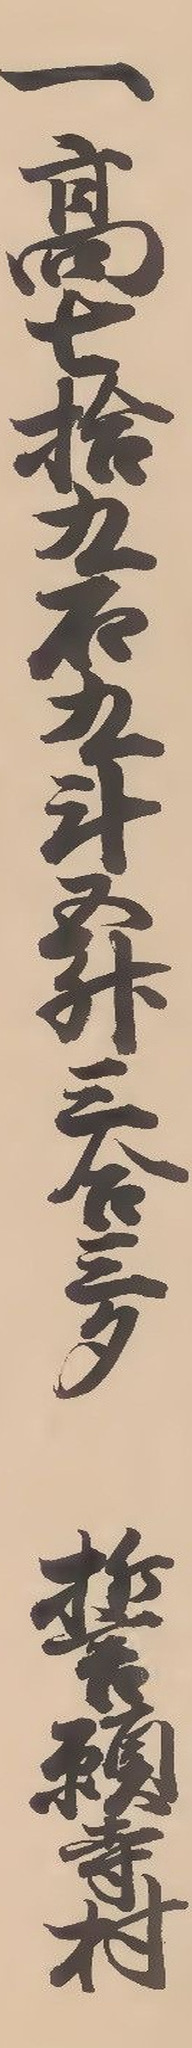一高七拾九石九斗五升三合三勺誓願寺村
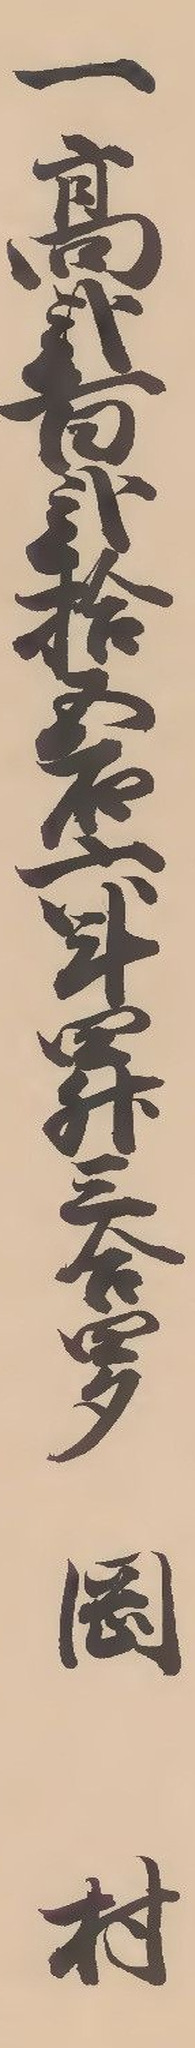一高弐百弐拾五石六斗四升三合四勺岡村
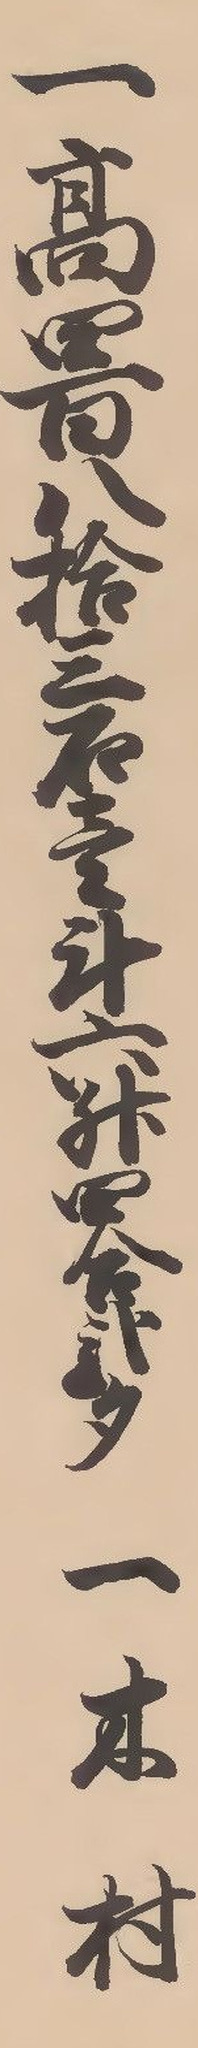一高四百八拾三石壱斗六升四合弐勺一木村
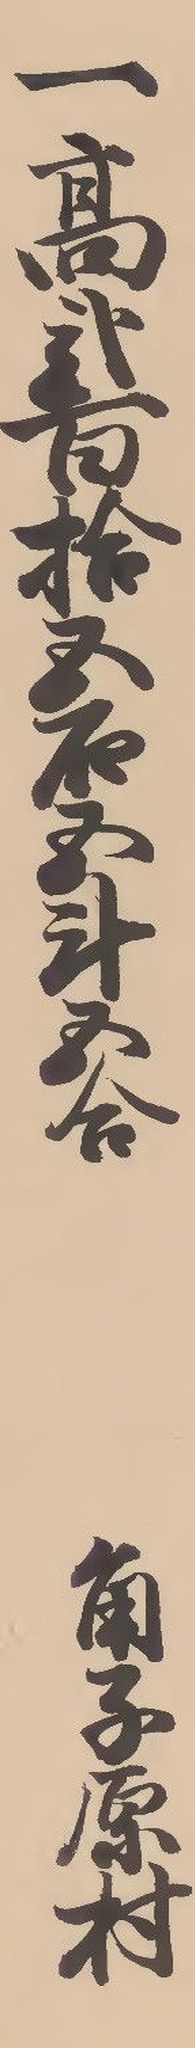一高弐百拾五石五斗五合角子原村

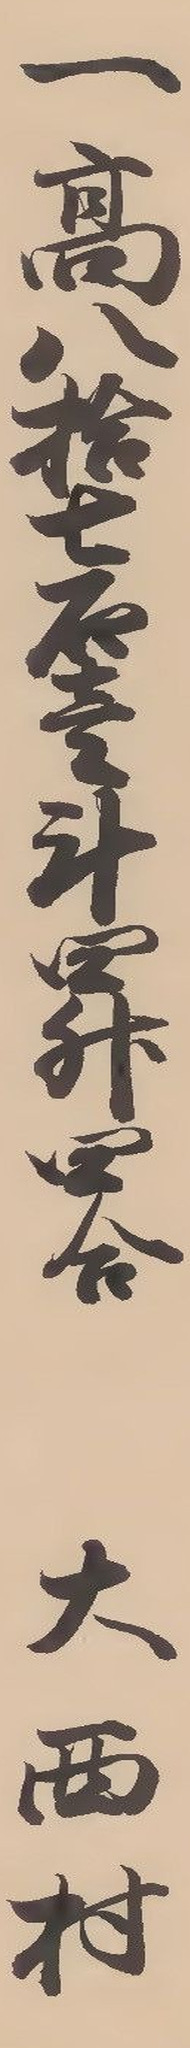一高八拾七石壱斗四升四合大西村
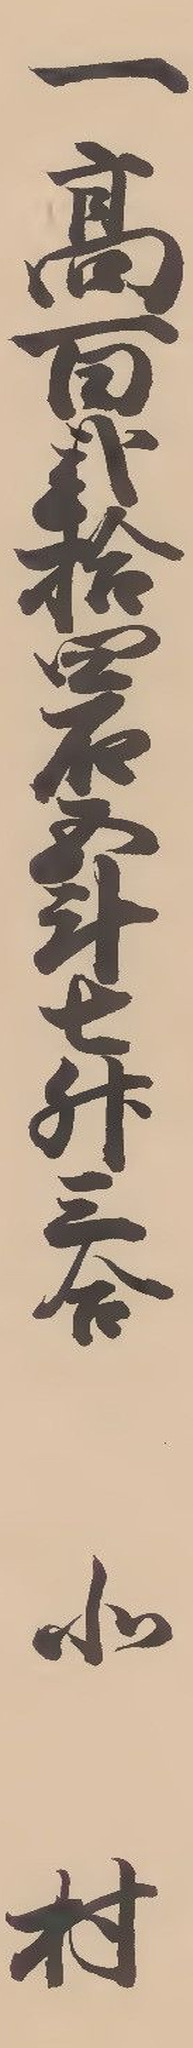一高百弐拾四石五斗七升三合北村
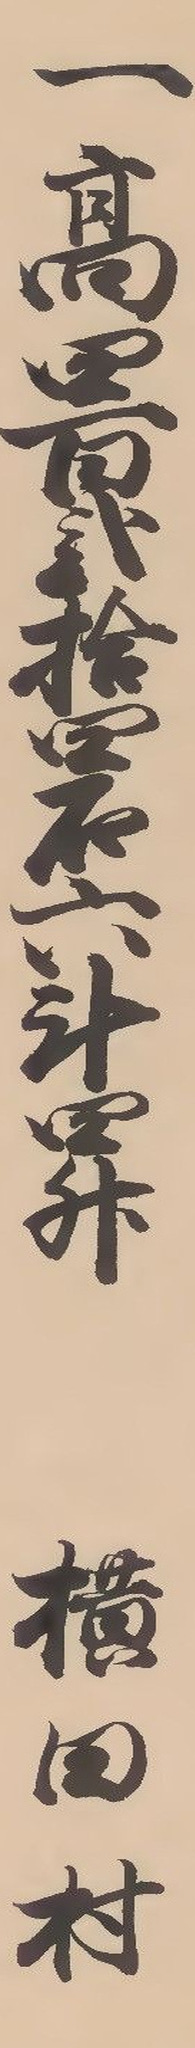一高四百弐拾四石六斗四升横田村
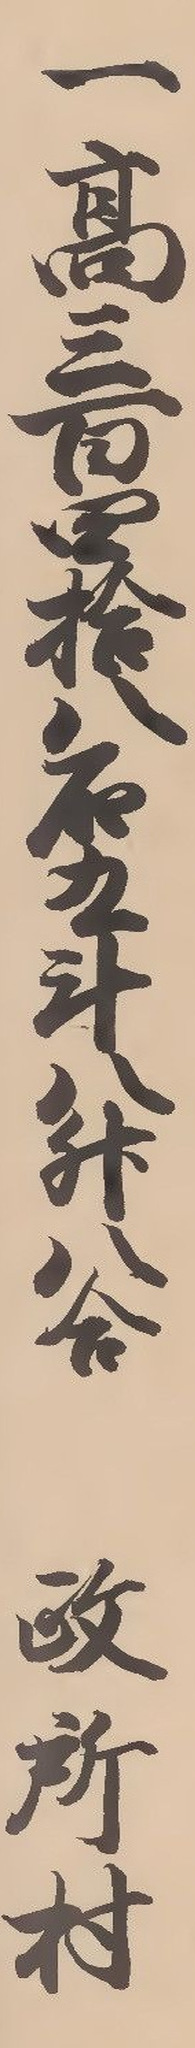一高三百四拾八石九斗八升八合政所村
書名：豊後国郷帳
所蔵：国立公文書館 National Archives of Japan
